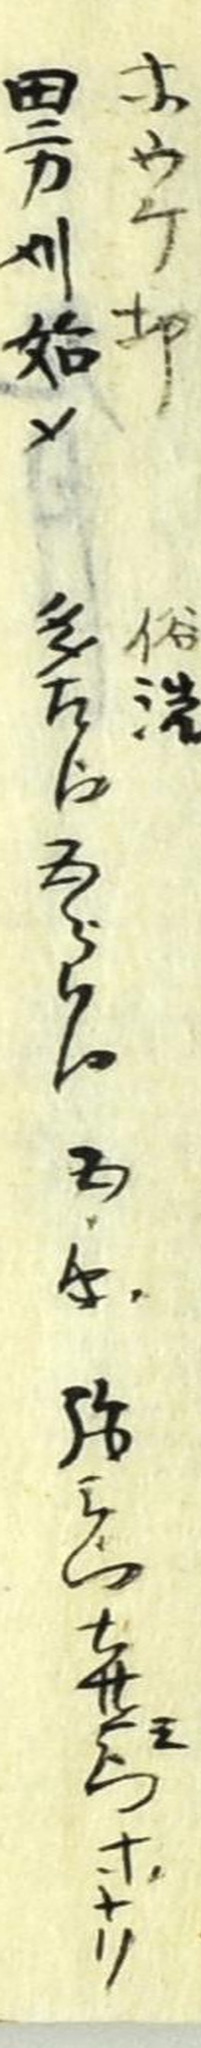田方刈始メ多左衛門五郎左衛門五兵衛弥与衛門喜三右衛門等ナリ
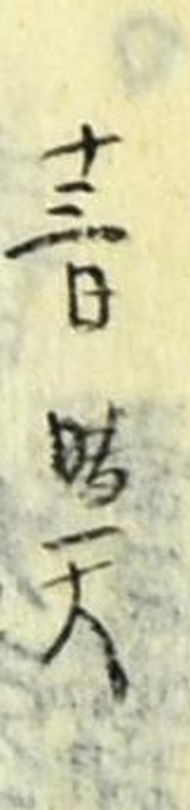十二日晴天

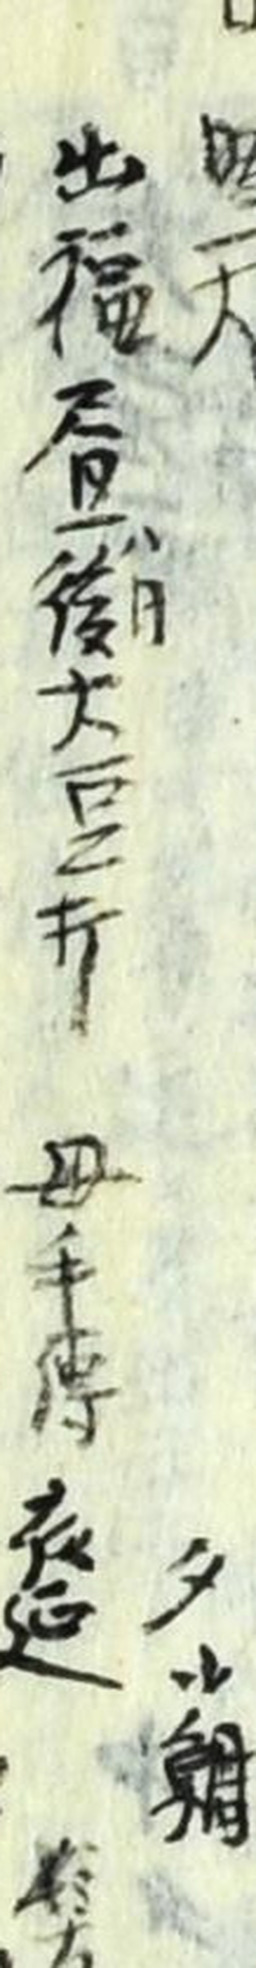出福昼後大豆打母手伝夜延髪
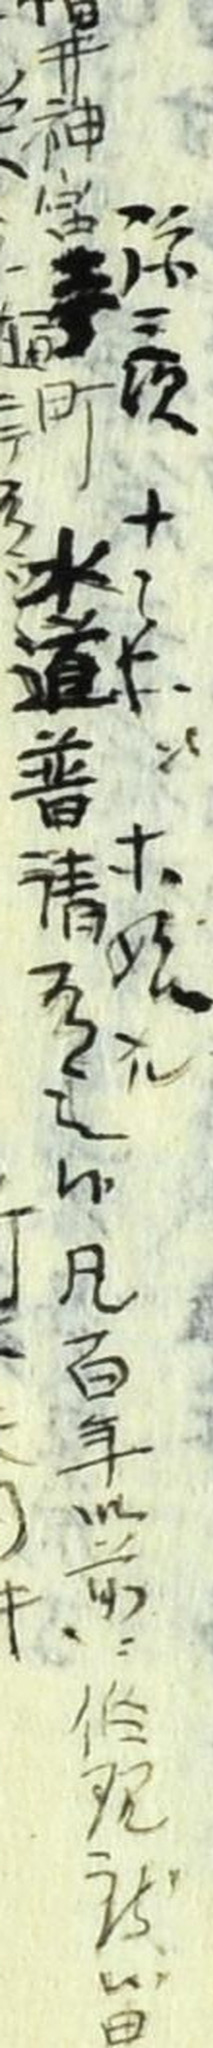福井神宮寺町水道普請有之候凡百年以前ニ修理致候由
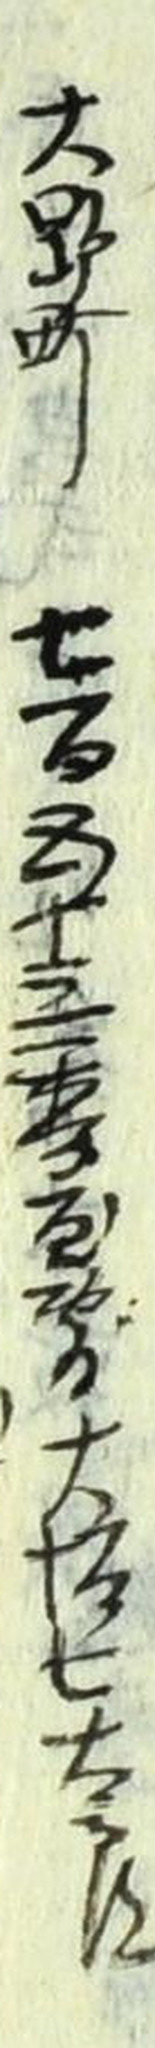大野町七百五十三番屋敷大坂七太郎
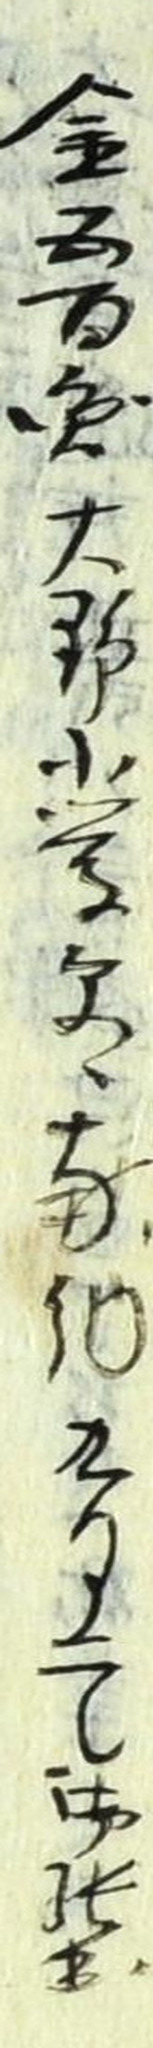金五百円大野小学受候献納九月二日御張出
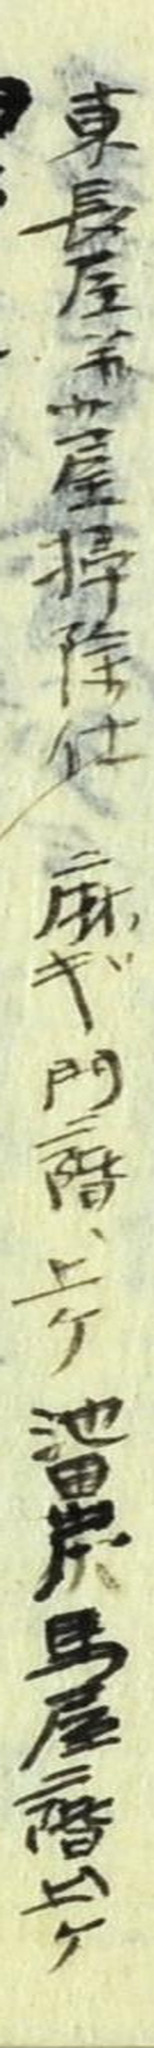東長屋幷小屋掃除仕麻ギ門二階へ上ケ池田炭馬屋二階へ上ケ
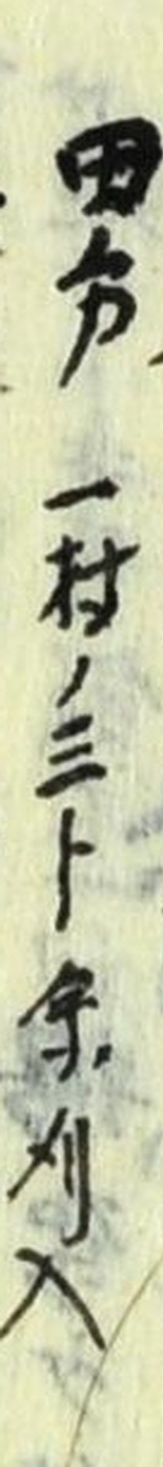田方一村ノ三歩余刈入
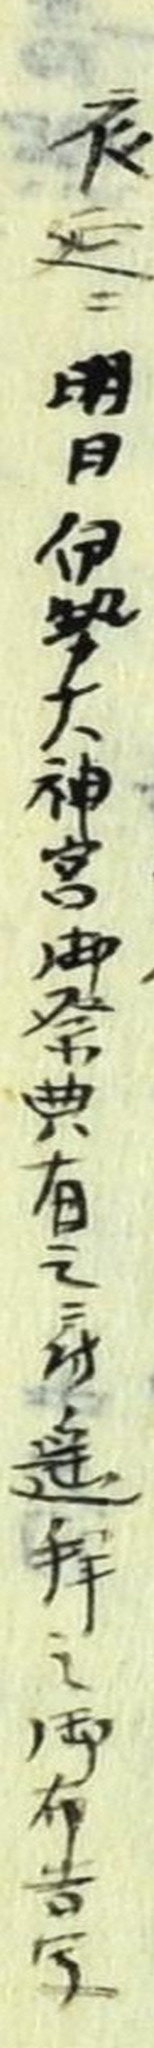夜延ニ明日伊勢大神宮御祭典有之ニ付遥拝之御布告写
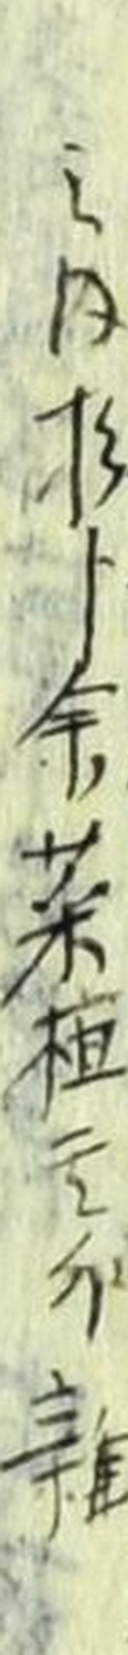之内拾歩余菜植其外雑
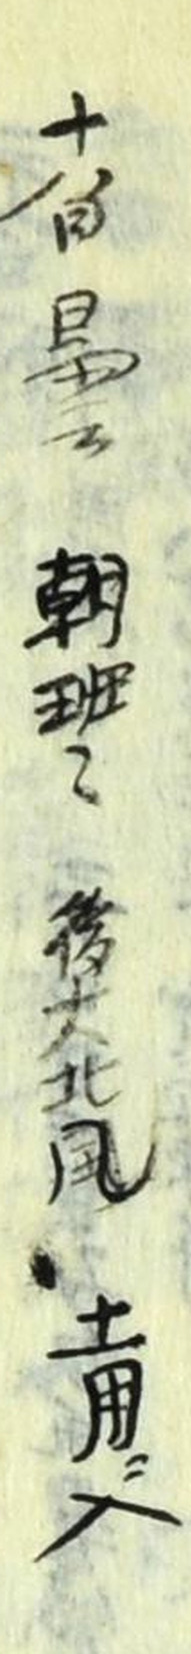十八日曇朝班々後大北風土用ニ入
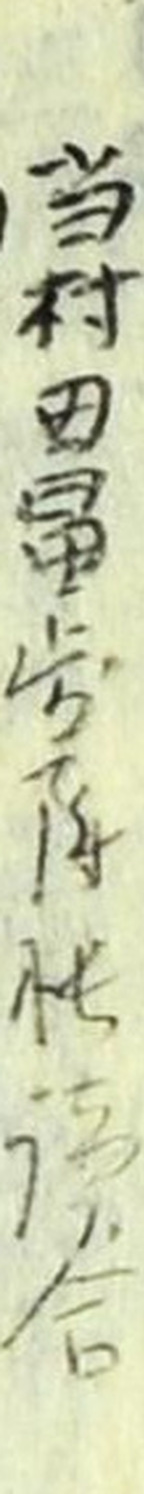当村田畠歩附帳読合
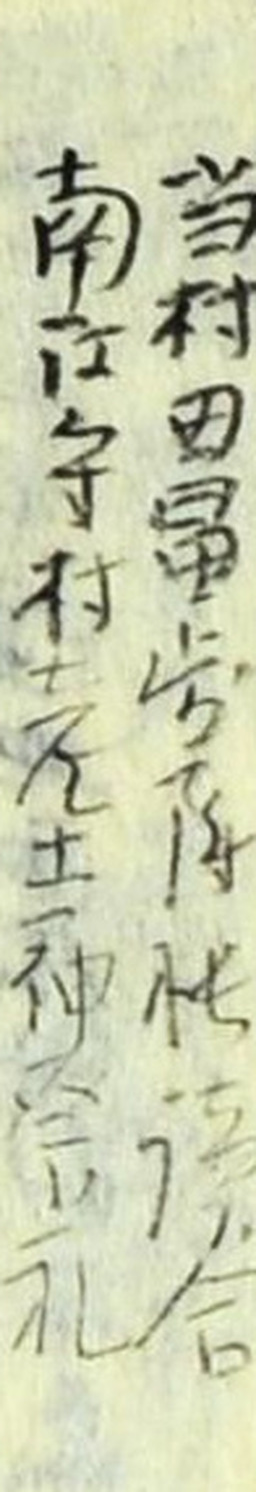南江守村産土神祭礼
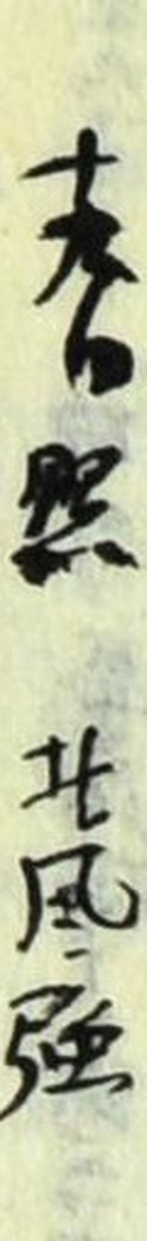十九日照北風強
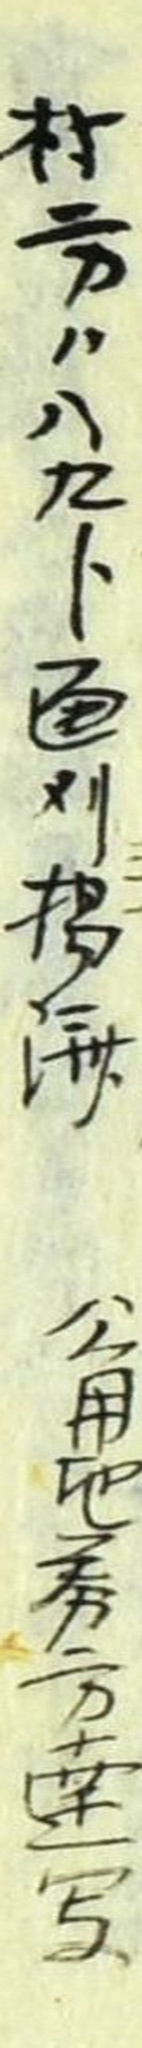村方ハ八九歩通刈揚済公用地券方達写

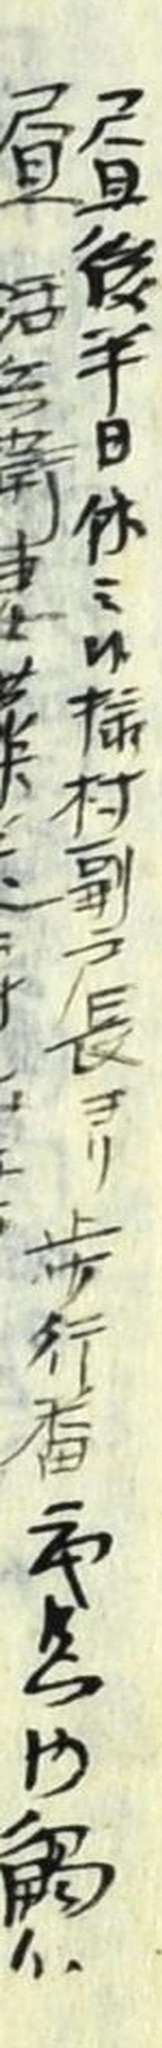昼後半日休ミ候様副戸長ヨリ歩行番武左衛門内触候
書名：（日記）
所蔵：福井県文書館 Fukui Prefectural Archives
